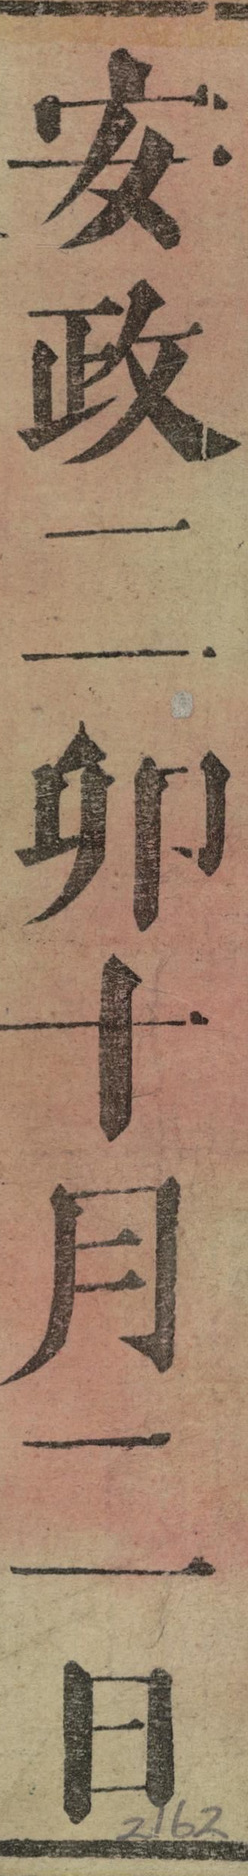安政二卯十月二日
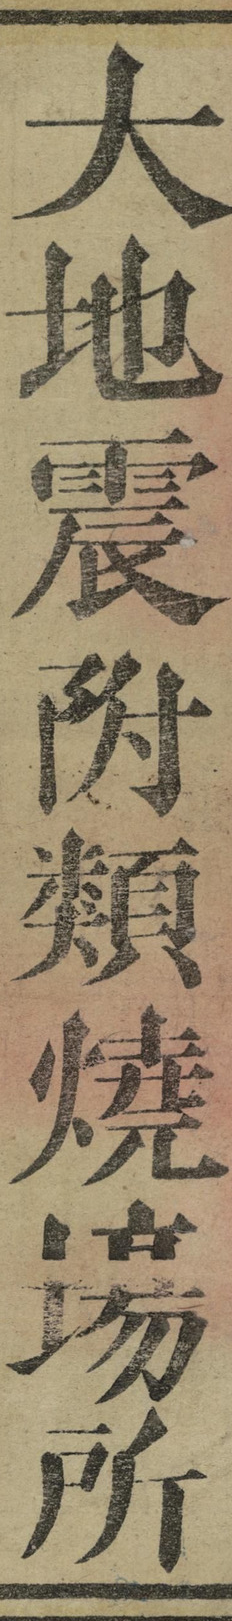大地震附類焼場所
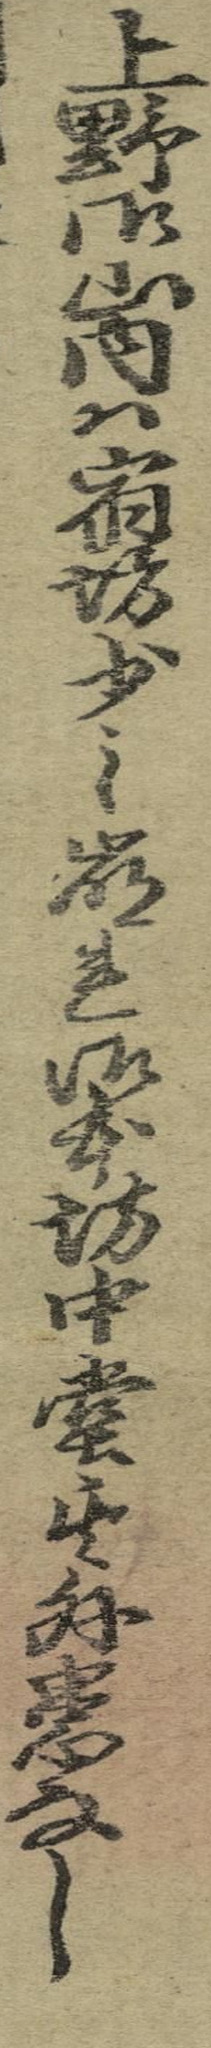上野御山内は宿坊少し崩れ御本坊中堂其外恙なし
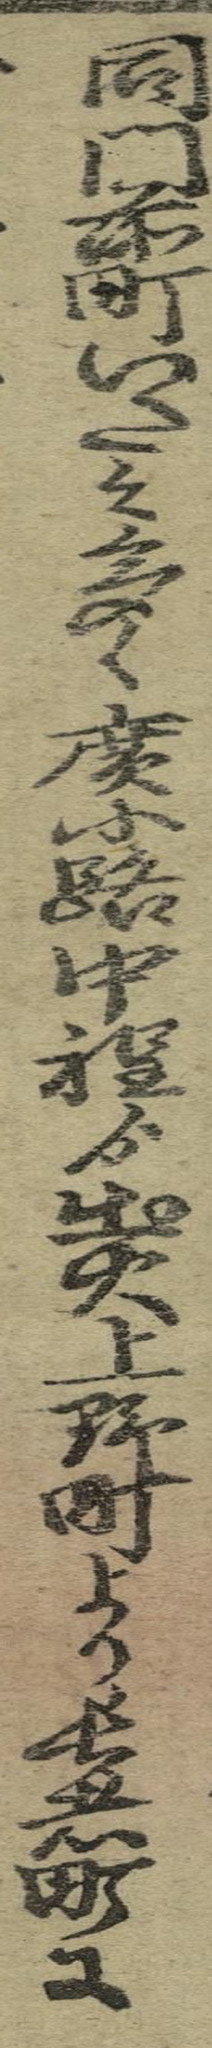同門前町いたみ多く広小路中程ゟ出火上野町より長者町に
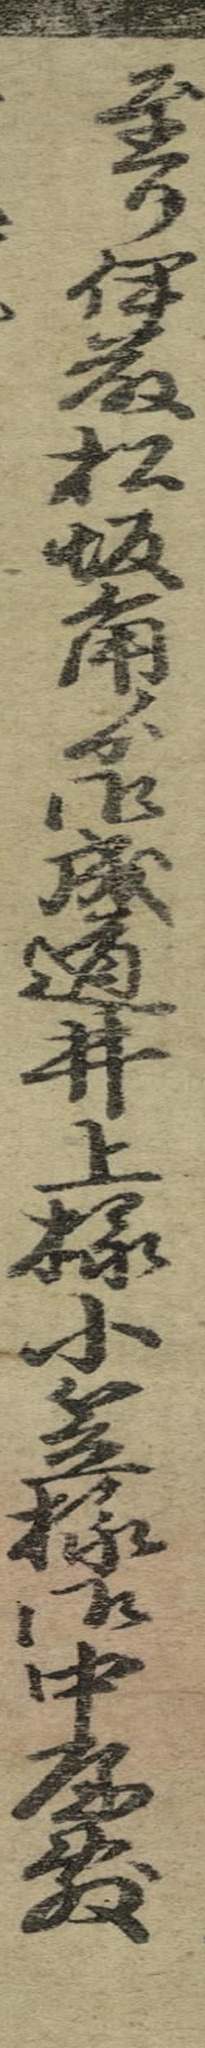至り伊藤松坂南ゟ御成道井上様小笠原様御中屋敷
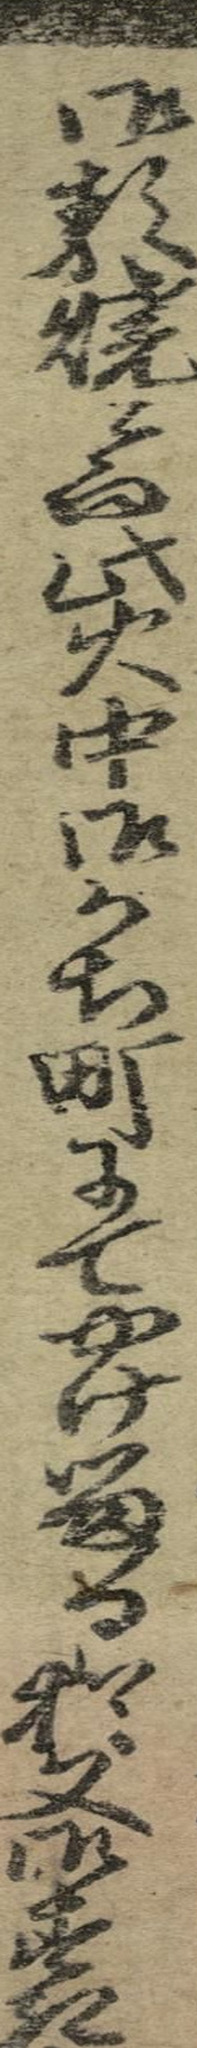御類焼二而此火中御かち町までやけ留る猶又御すきや町
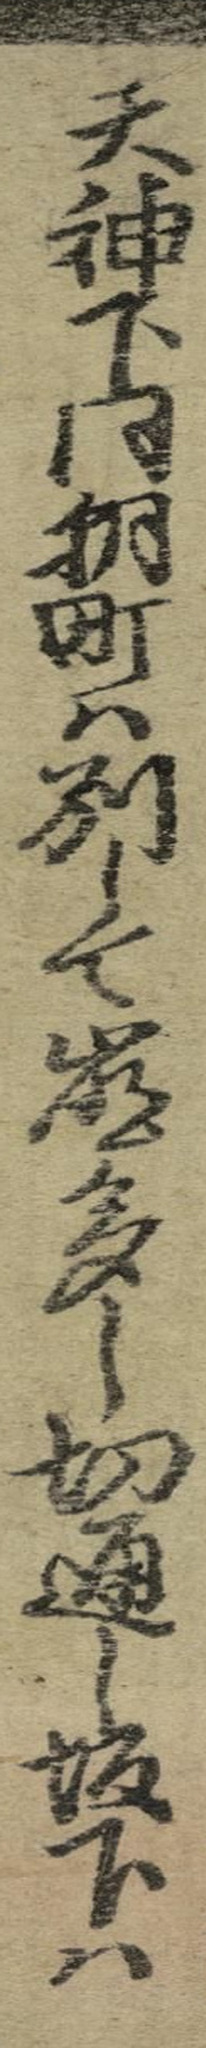天神下同朋町は別して崩多し切通し坂下は
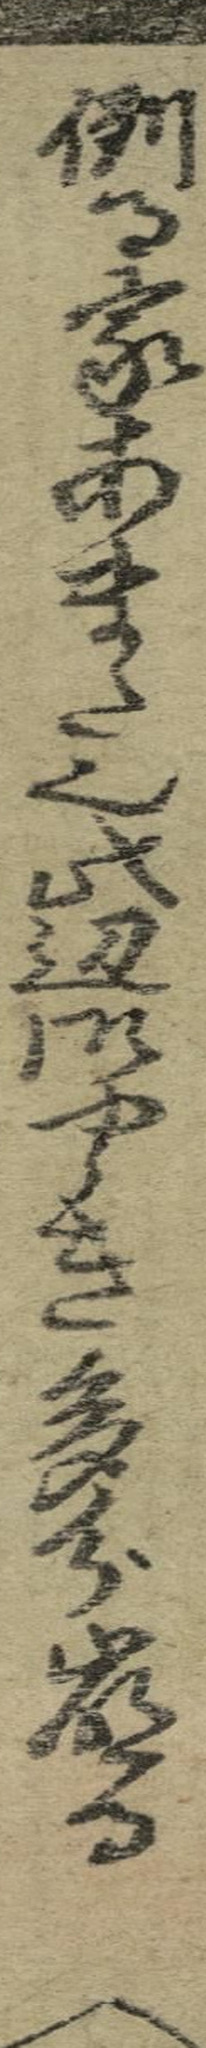倒る家あまた也此辺御やしき多分崩る
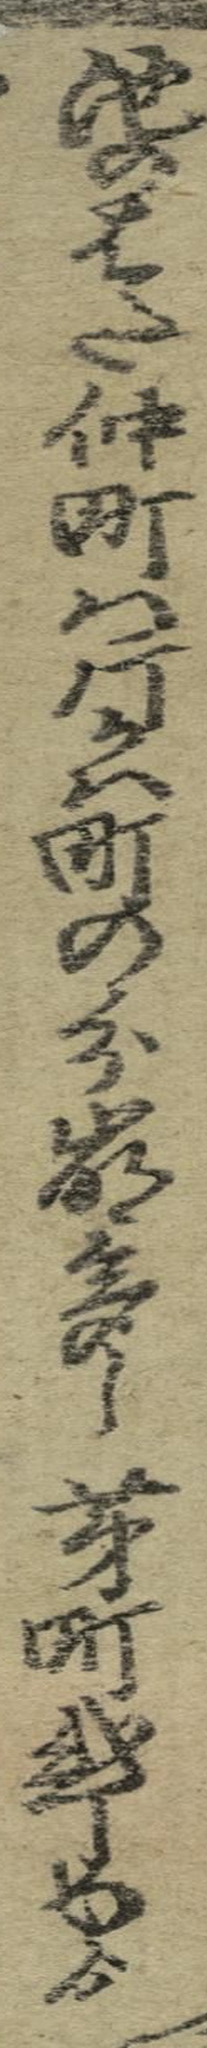池のはた仲町は片かは町の分崩多し茅町弐丁めゟ
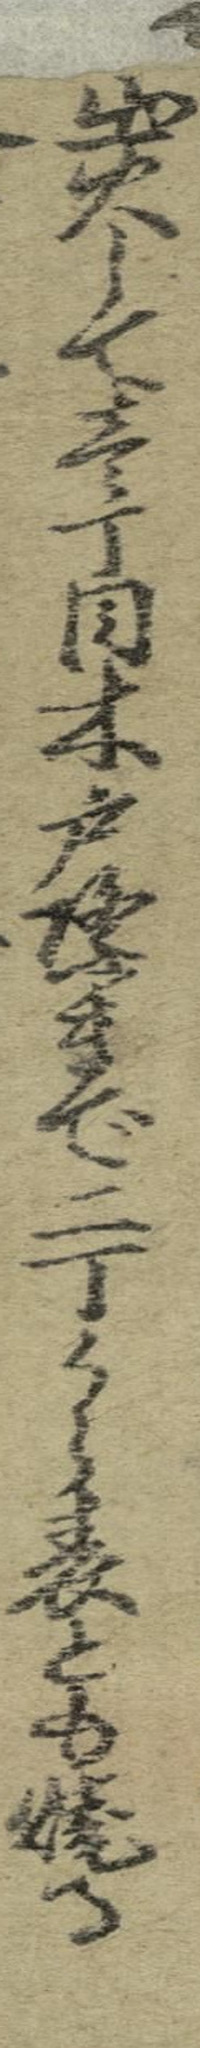出火して壱丁目木戸際まで二丁うら表とも焼る
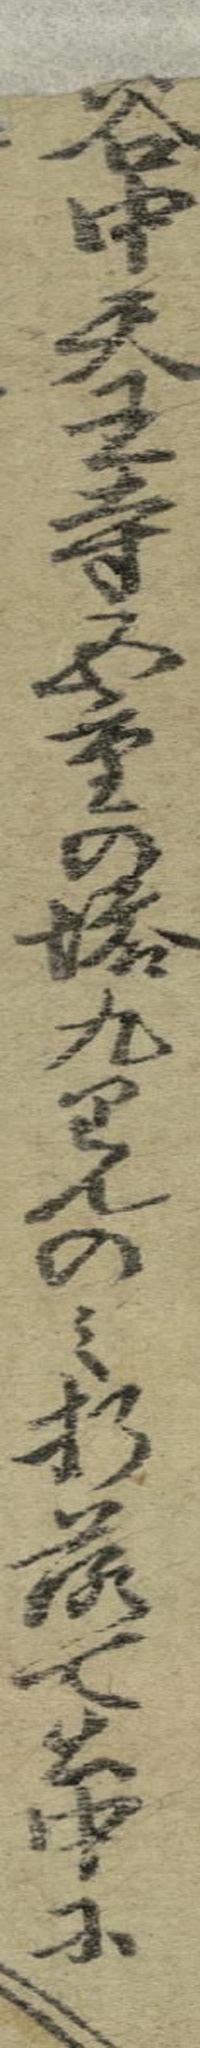谷中天王寺五重の塔九りんのみ折落て土中に
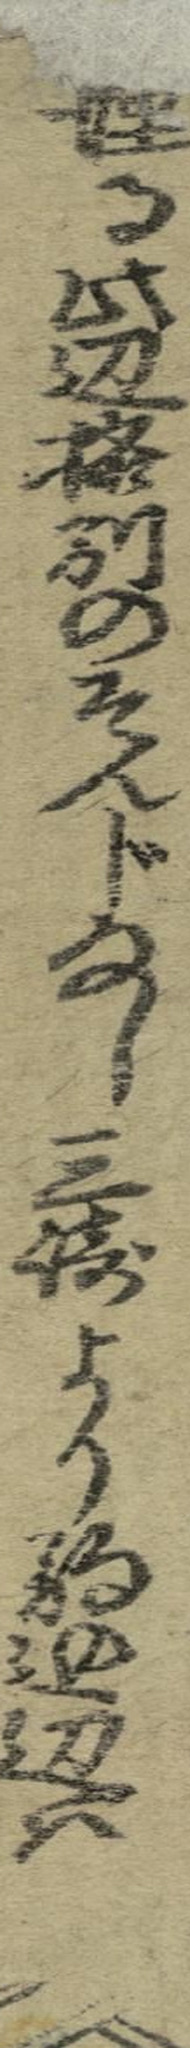埋る此辺格別のそんじなし三崎より駒込辺は
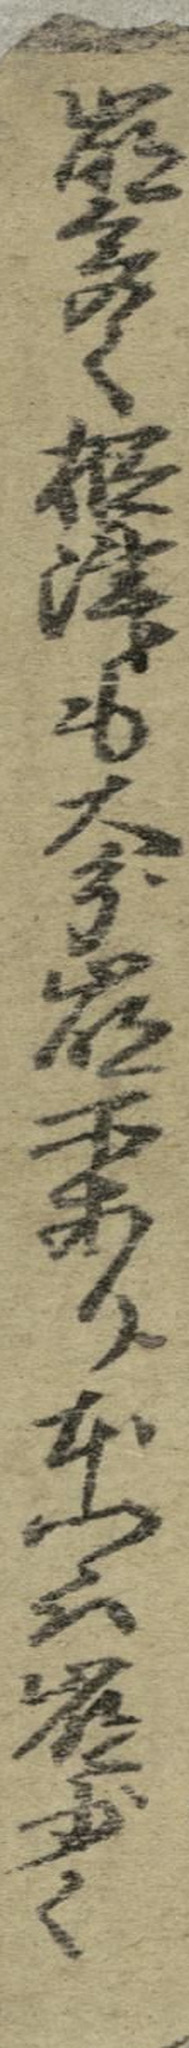崩多く根津も大分崩所あり本郷は崩少く
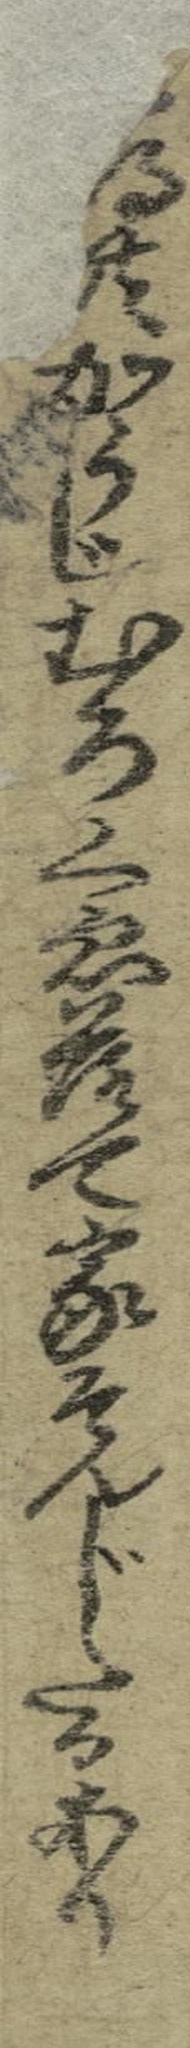候得共かうじむろくゑ落て家そんじたるあり
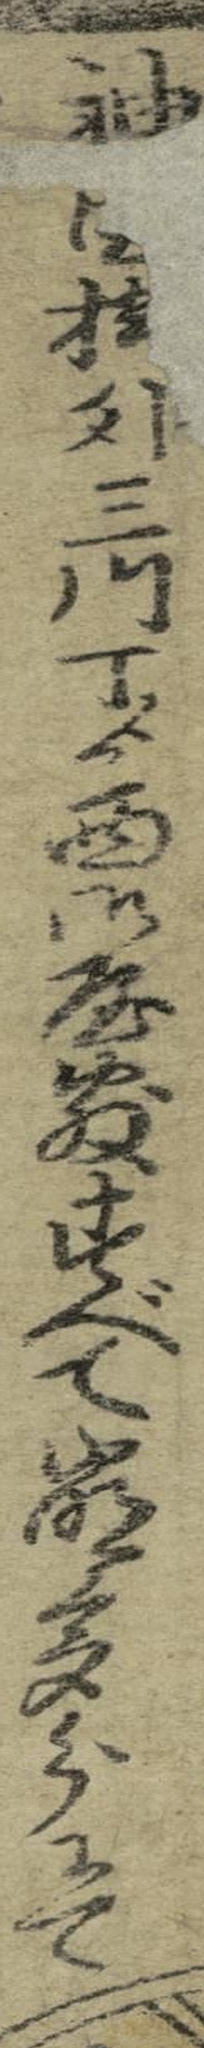神田橋外三川丁ゟ西御屋敷すべて崩多分にて
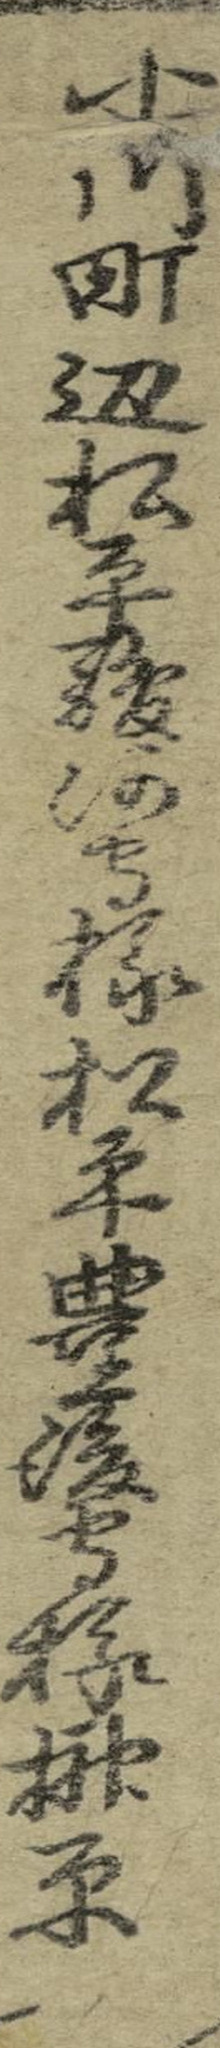小川町辺松平駿河守様松平豊後守様榊原
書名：安政二卯十月二日大地震附類焼場所
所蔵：東京大学地震研究所図書室 Earthquake Research Institute Library, The University of Tokyo, JAPAN
